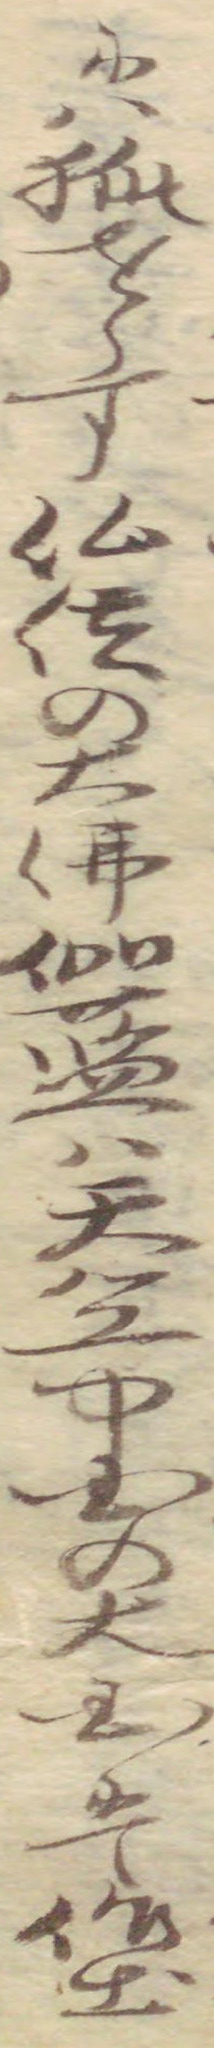には狐をらす仏法の大仏伽藍は天竺中国の大国にて作出
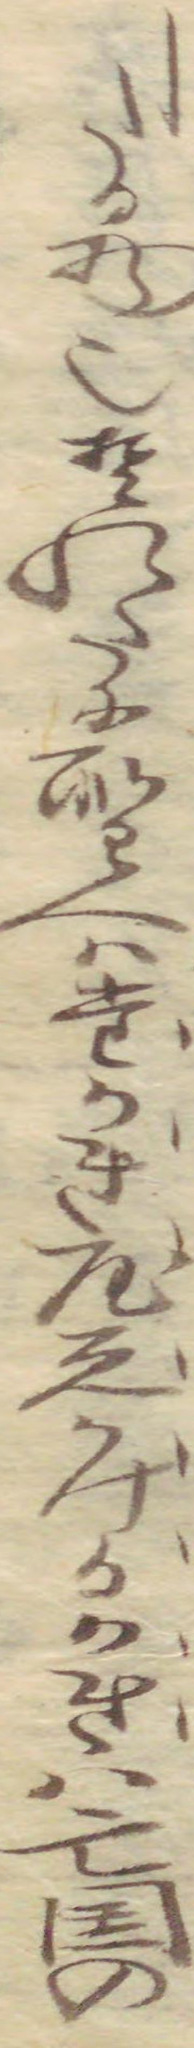したる物也それたに聖人はたかき屋ゑかけるかきは亡国の
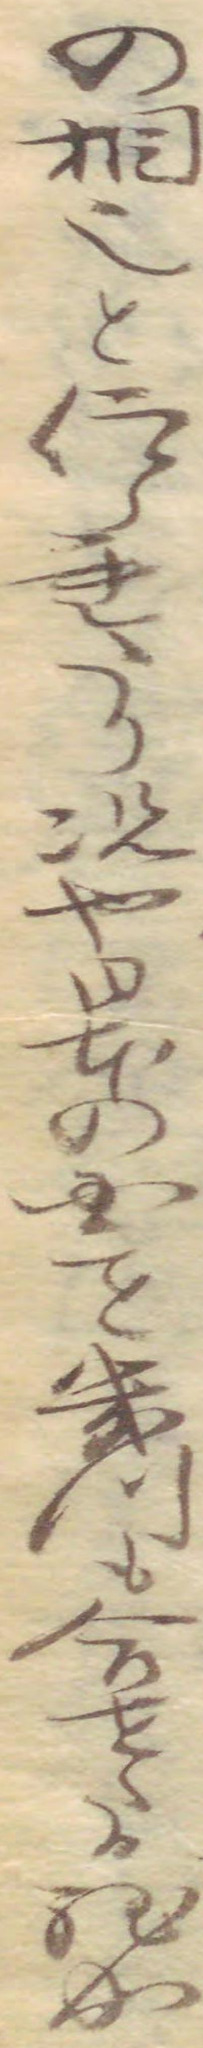の相也と仰られたり況や日本の国を幾つも合せたる程成

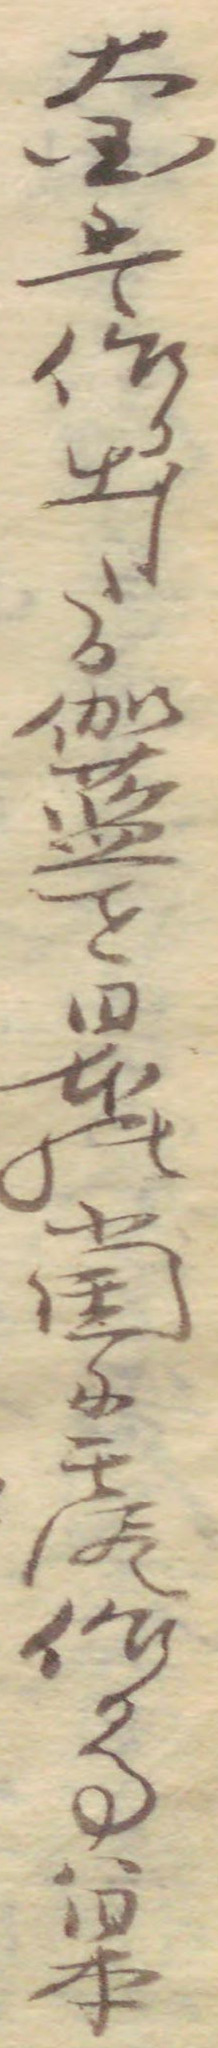大国にて作り出したる伽藍を日本の小国に其侭作る事は日本
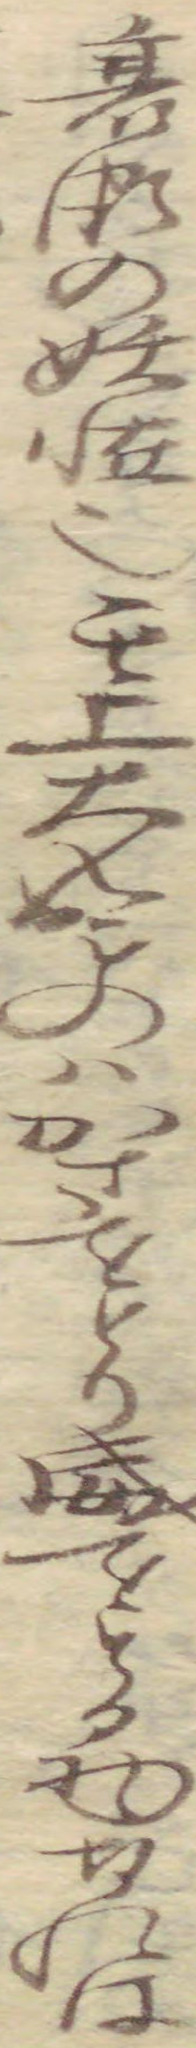衰微の妖怪也其上大成ものはかさをとり威をとる物なれは
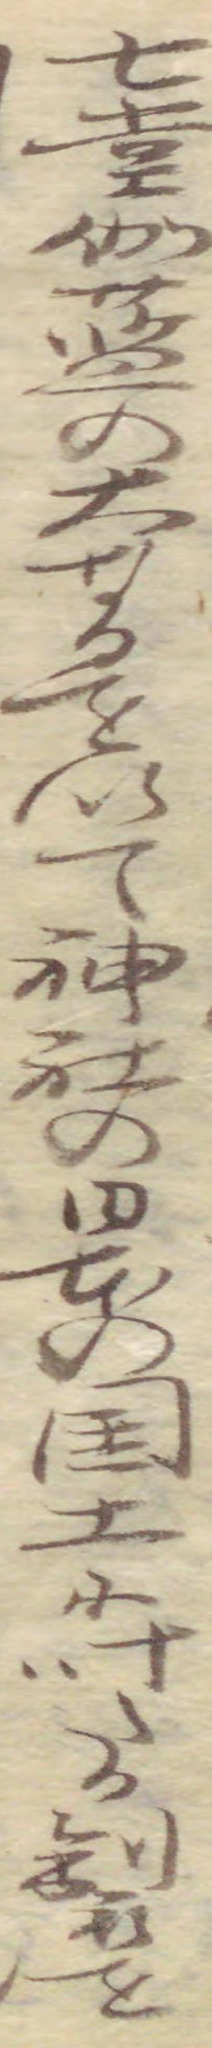七堂伽藍の大なるを以て神社の日本の国土に叶たる製を
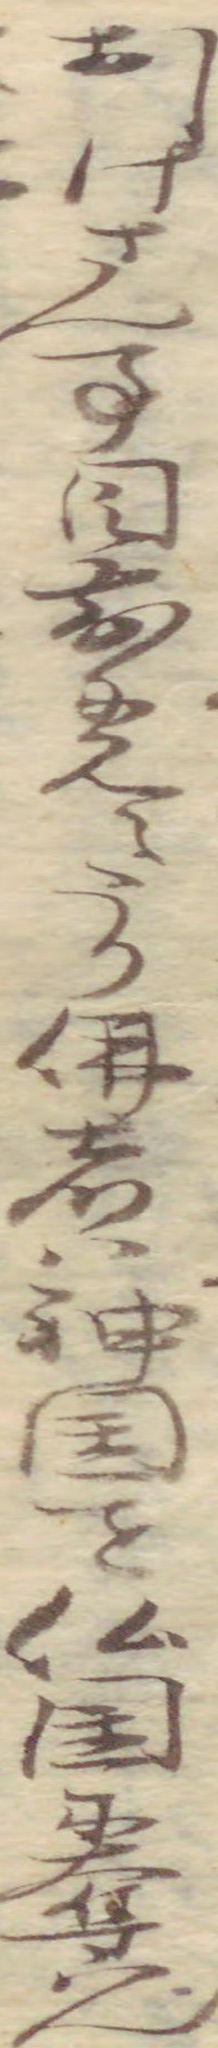おしけさん事目前に見えたり仏者は神国を仏国に奪はん
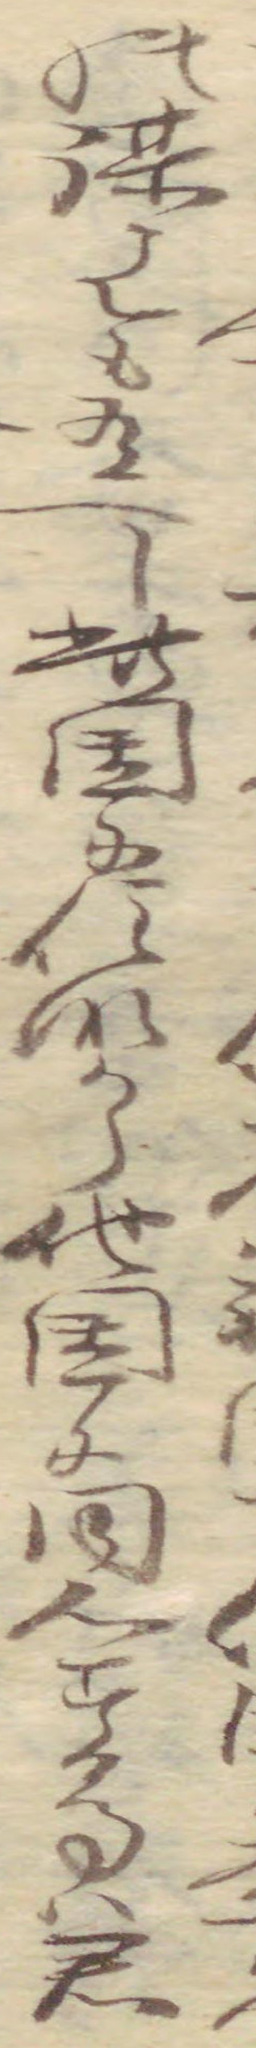の謀ニても有へし此国に住なから他国に同心する事は君
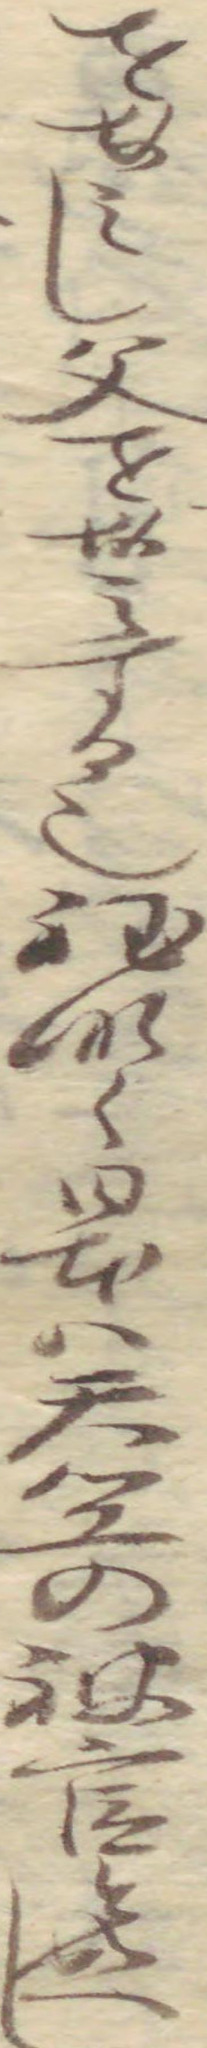をなみし父をなみする也程なく日本は天竺の被官と成へし
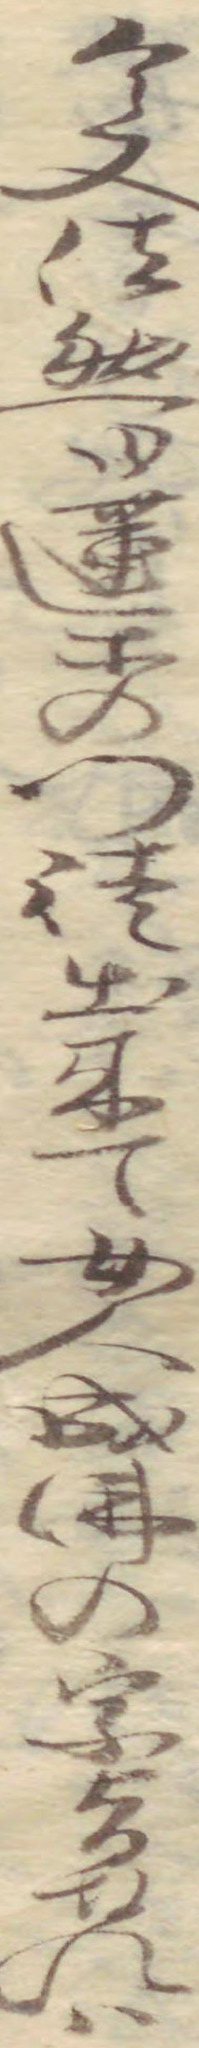今又法然日蓮等の門徒出来て女人成仏の宗旨なれは
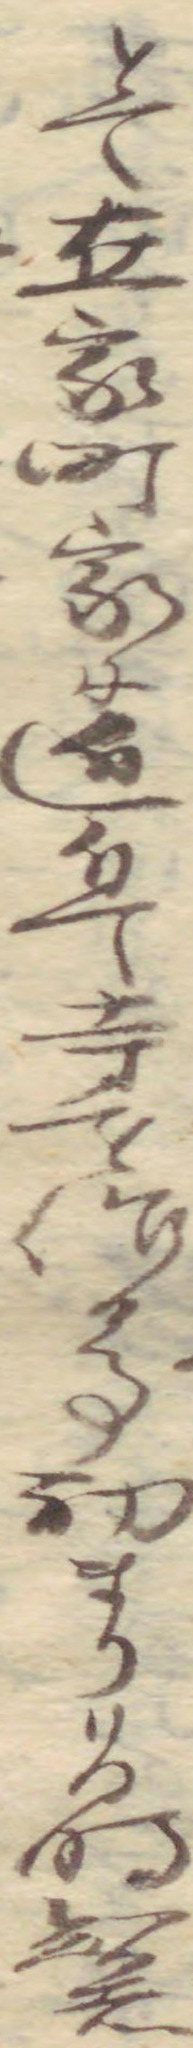とて在家町家に近付て寺を作る事初まりける時知る者
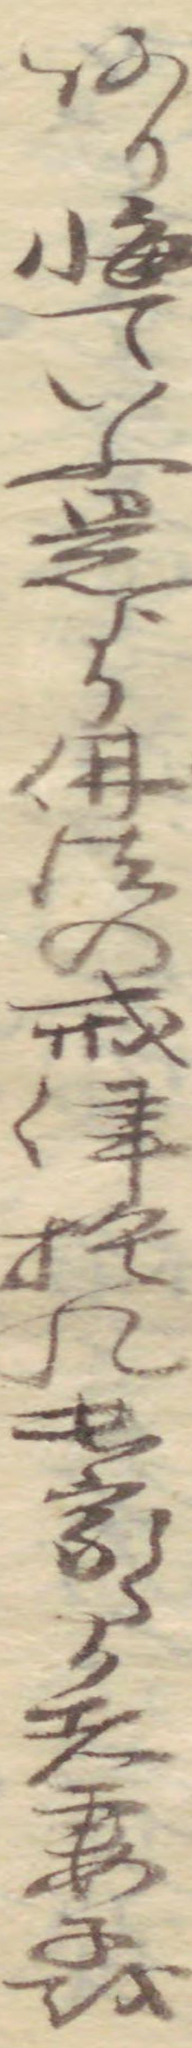あり悔ていふ是より仏法の戒律捨れ出家たる者妻子を
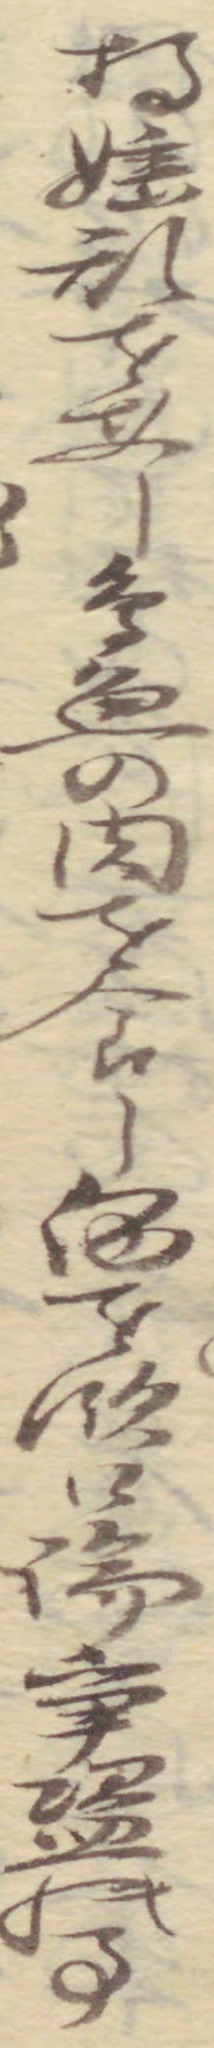持淫乱をなし鳥魚の肉を食し酒を飲口論争盜の事
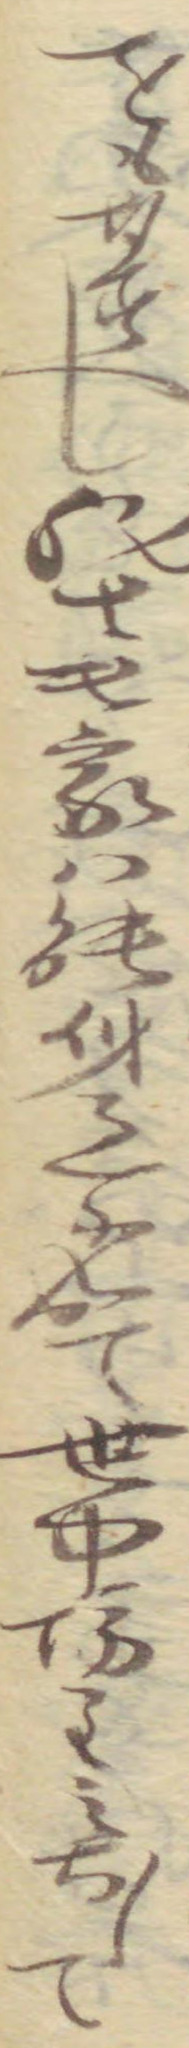をもなすへし然は出家は能身過に成て世中坊主みち〳〵て
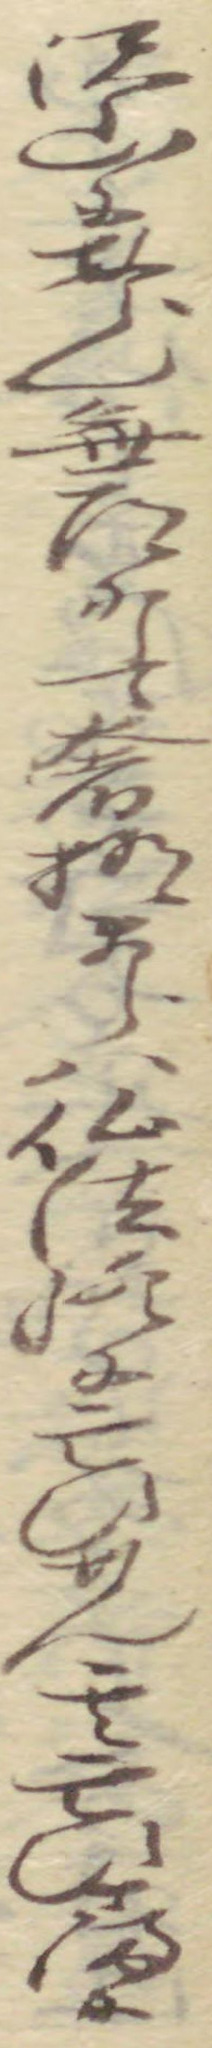沢山にならん無道にして奢極まらは仏法終に亡ひなん其亡ひさまに
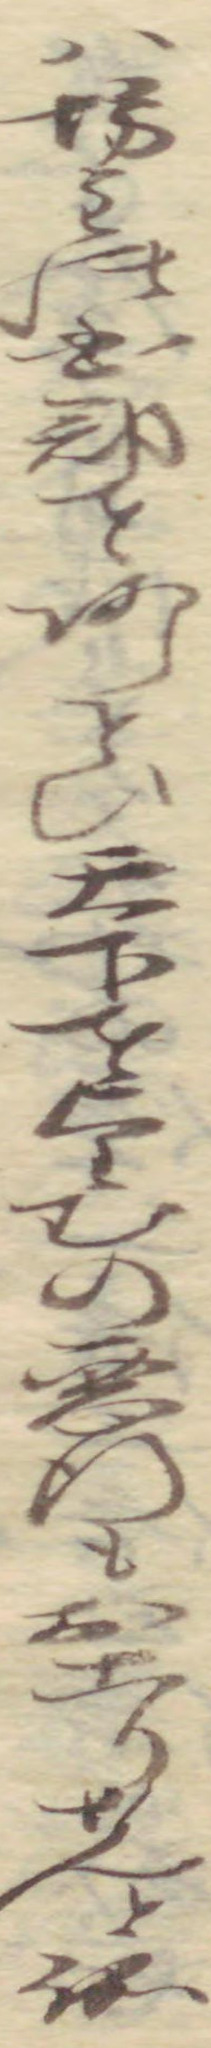は坊主の国郡をあらそひ天下を望むの悪行もおこりなんと誠
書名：鶯宿雑記. 巻263-264
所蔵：国立国会図書館 National Diet Library, JAPAN
